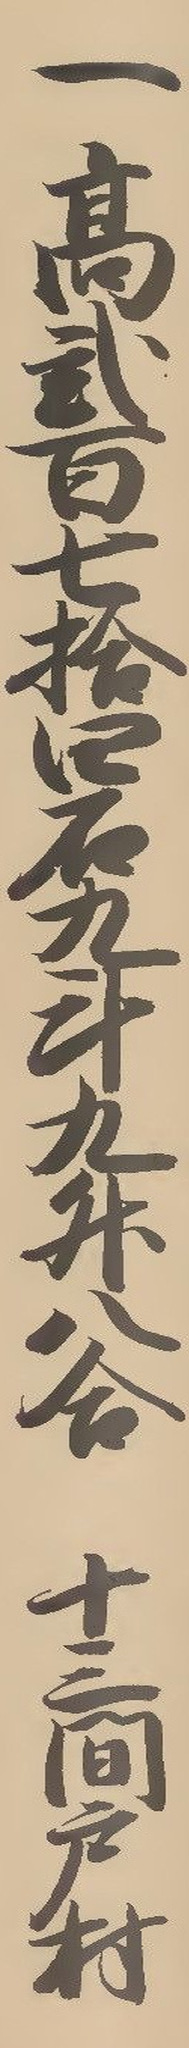一高弐百七拾四石九斗九升八合十三間戸村
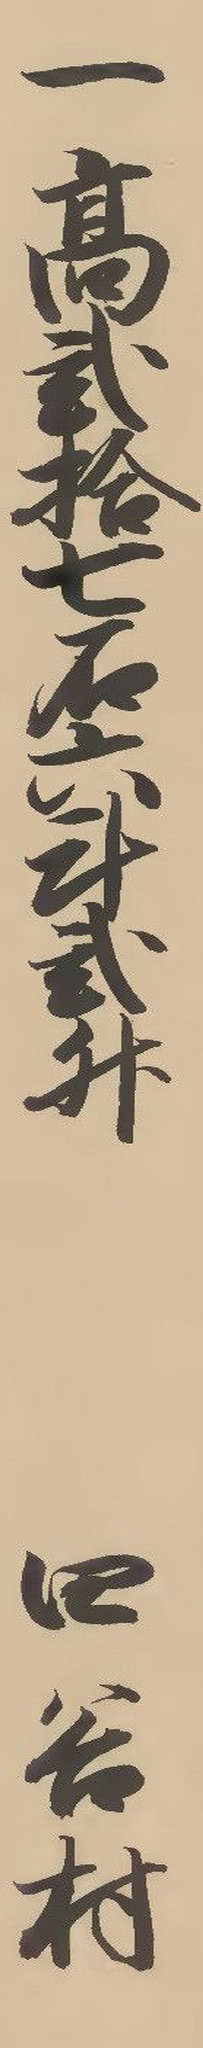一高弐拾七石六斗弐升四谷村
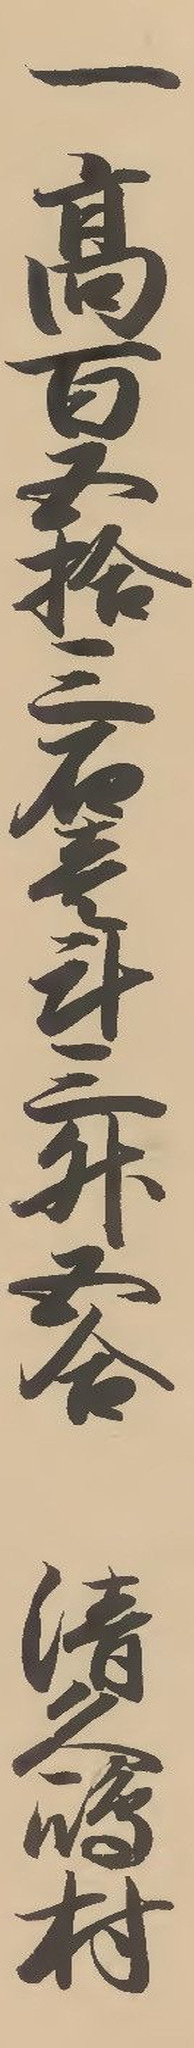一高百五拾三石壱斗三升五合清久島村
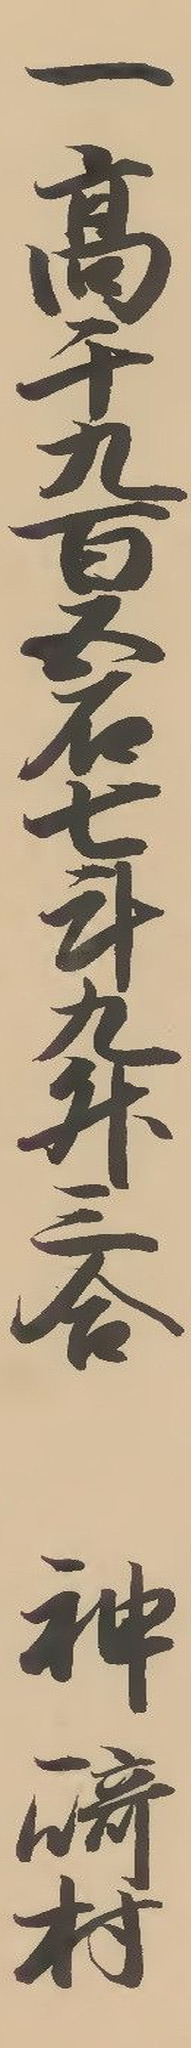一高千九百五石七斗九升三合神崎村

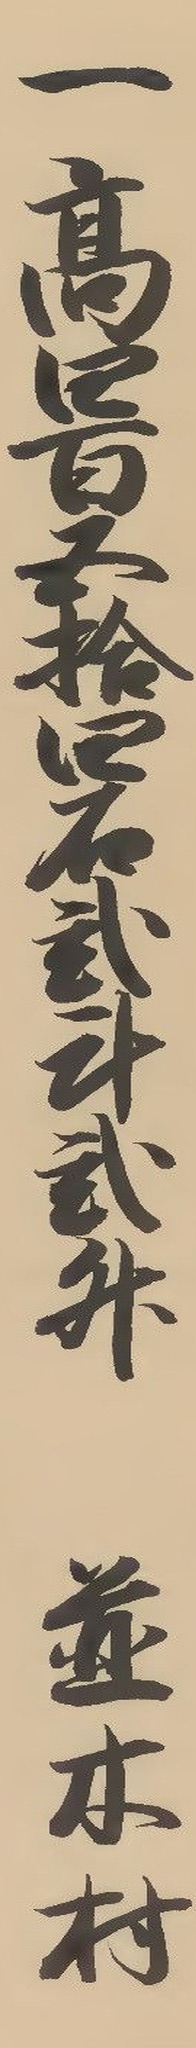一高四百五拾四石弐斗弐升並木村
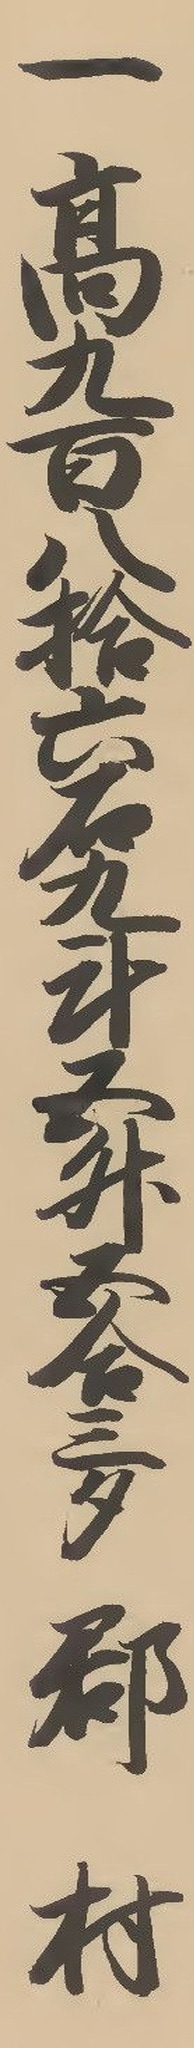一高九百八拾六石九斗五升五合三勺郡村
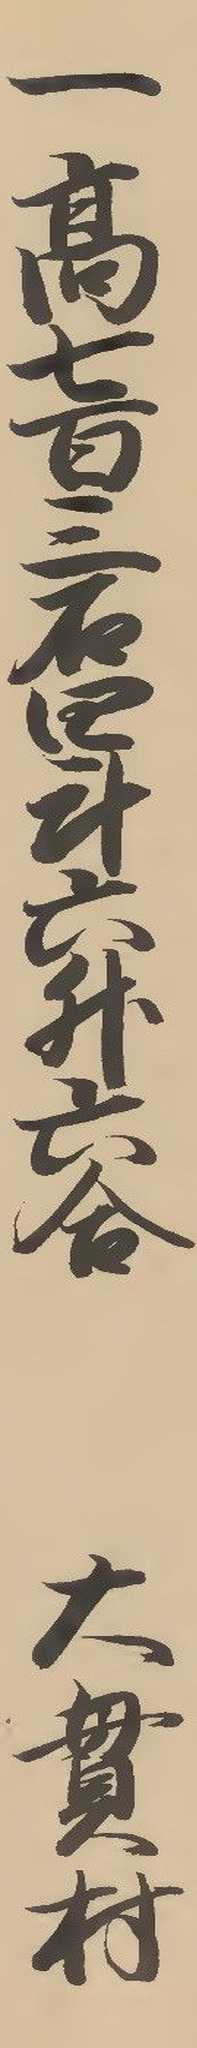一高七百三石四斗六升六合大貫村
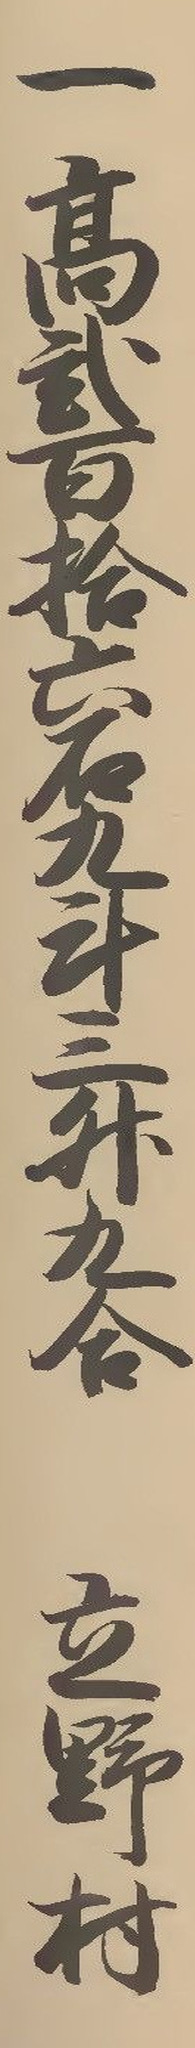一高弐百拾六石九斗三升九合立野村
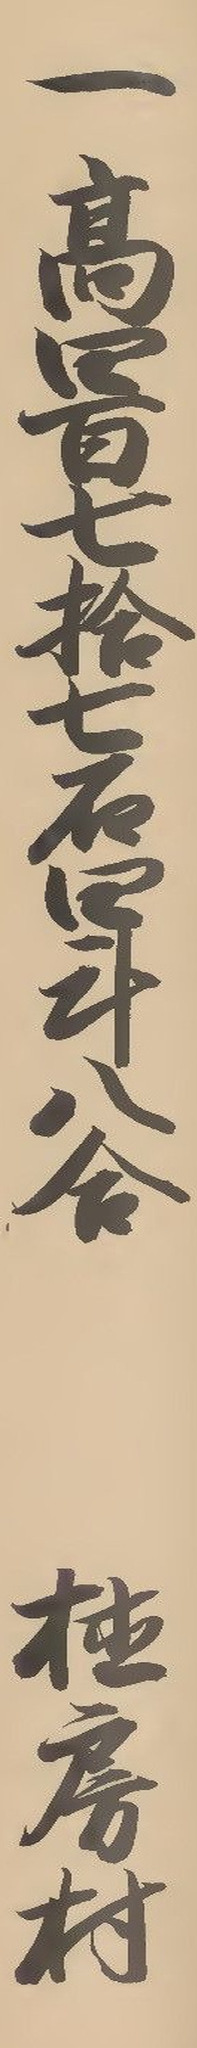一高四百七拾七石四斗八合植房村
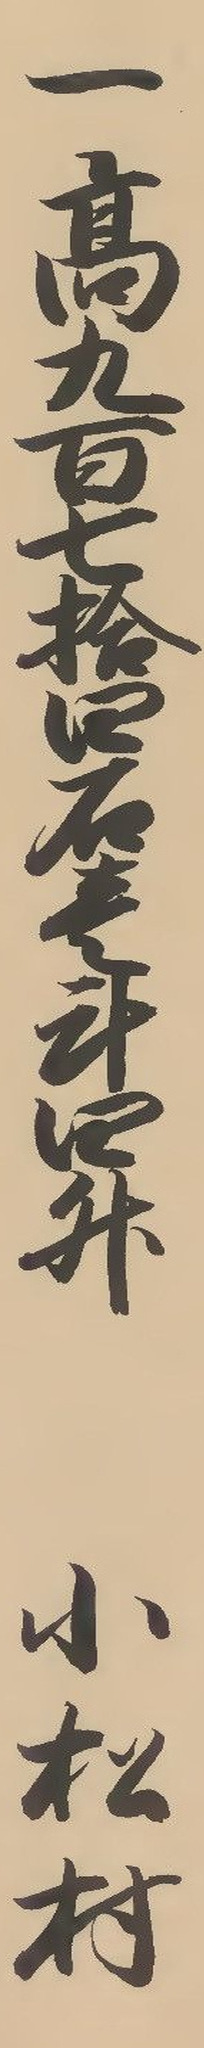一高九百七拾四石壱斗四升小松村
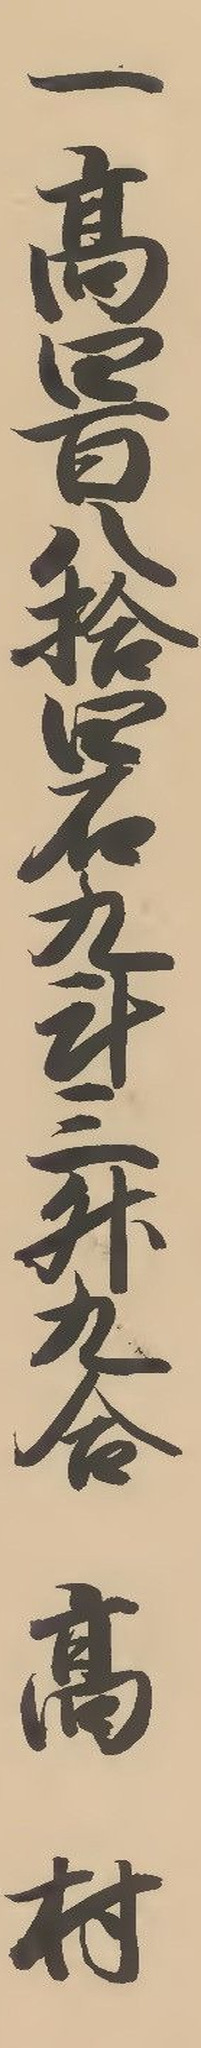一高四百八拾四石九斗三升九合高村
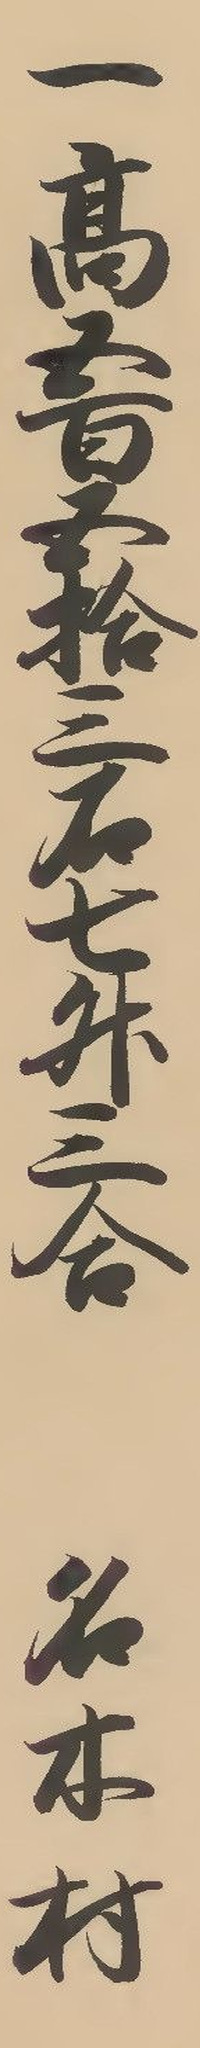一高五百五拾三石七升三合名木村

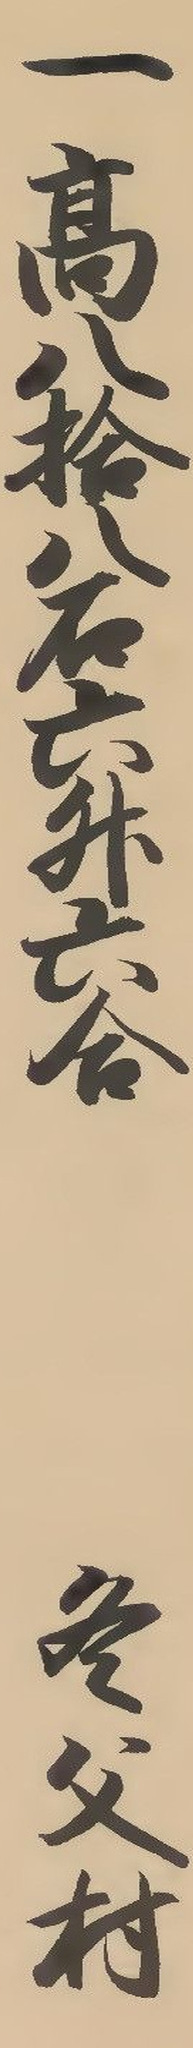一高八拾八石六升六合冬父村
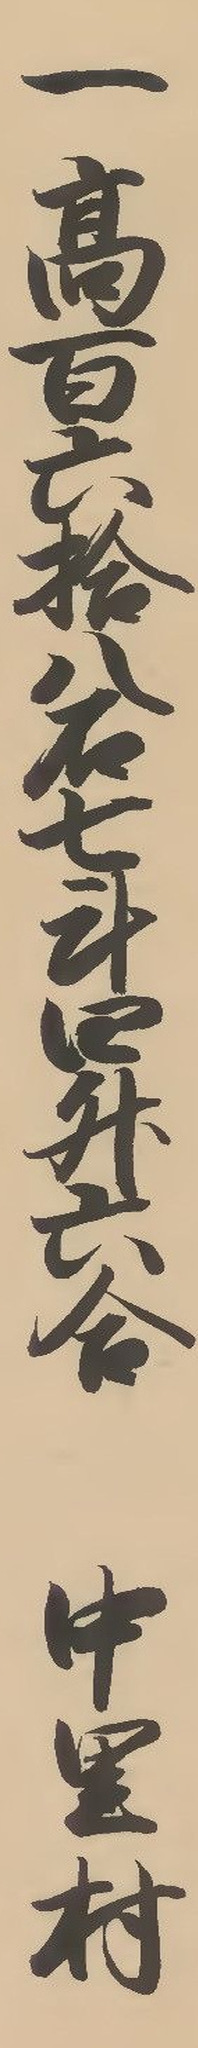一高百六拾八石七斗四升六合中里村
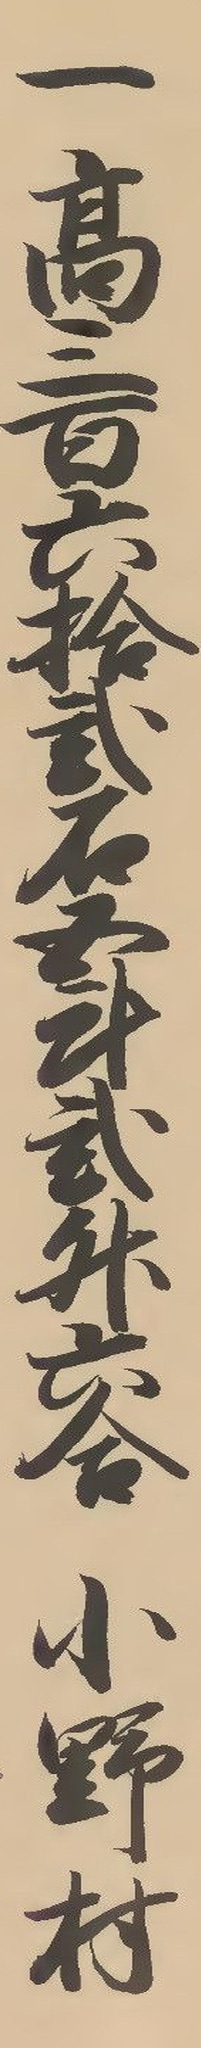一高三百六拾弐石五斗弐升六合小野村
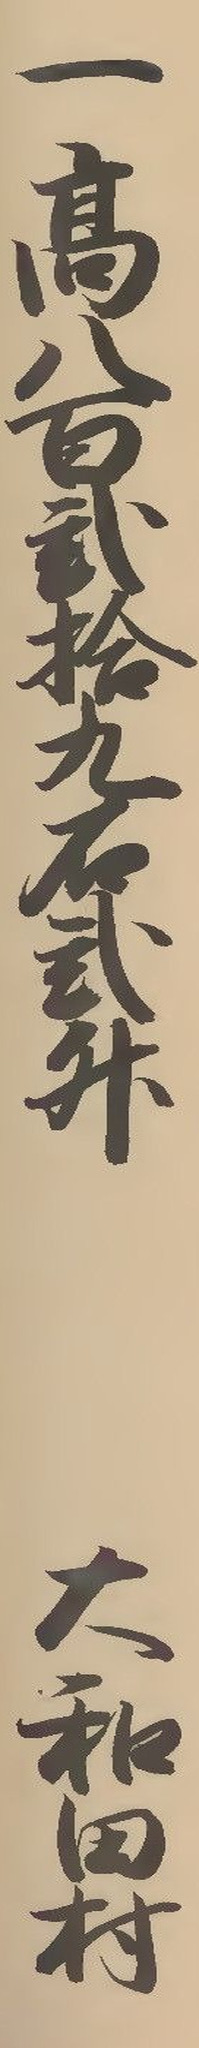一高八百弐拾九石弐升大和田村
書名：下総国郷帳
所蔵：国立公文書館 National Archives of Japan
